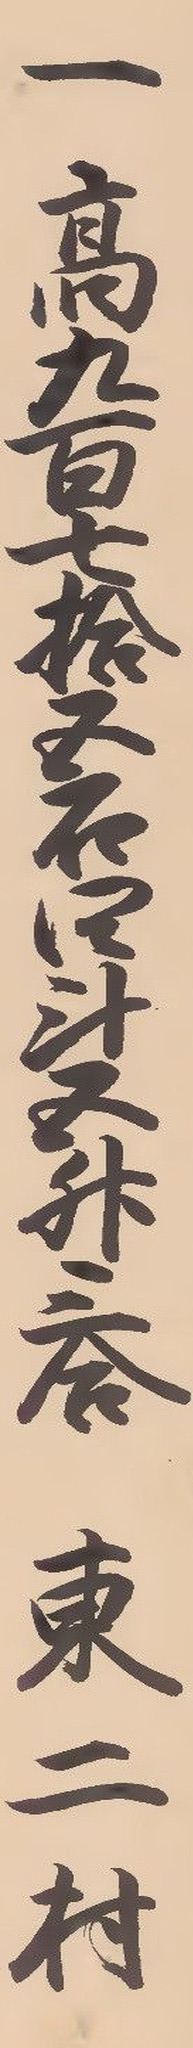一高九百七拾五石四斗五升三合東二村
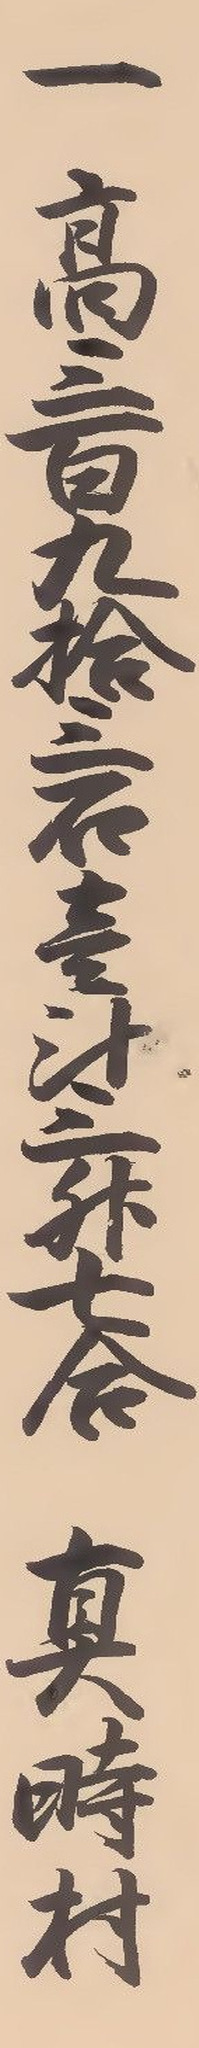一高三百九拾三石壱斗三升七合真時村
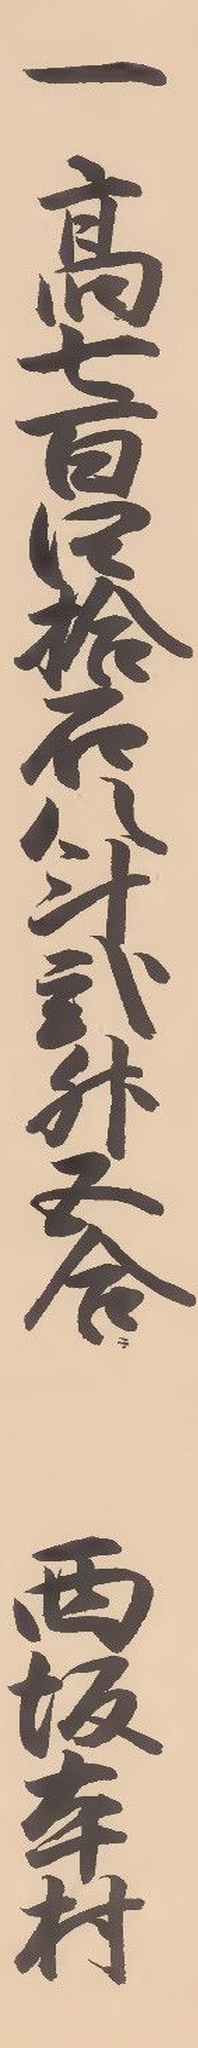一高七百四拾石八斗弐升五合西坂本村
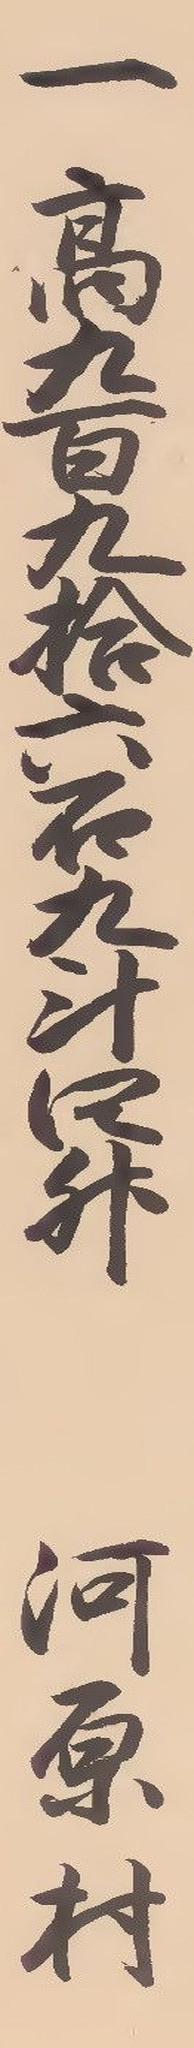一高九百九拾六石九斗四升河原村

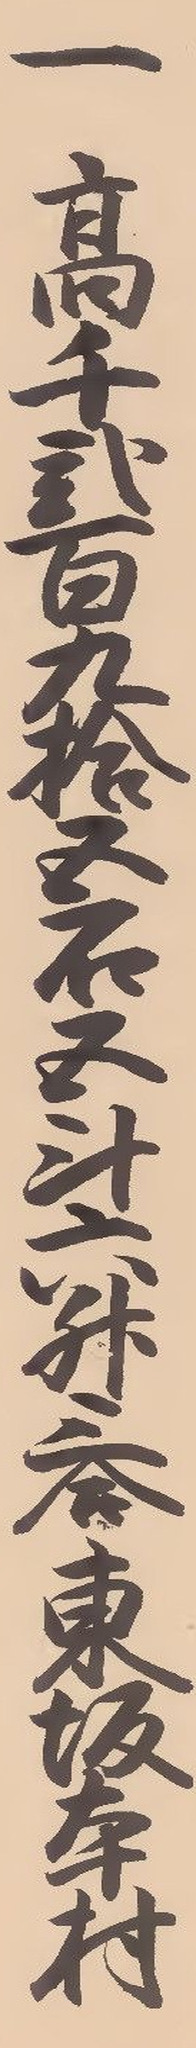一高千弐百九拾五石五斗六升三合東坂本村
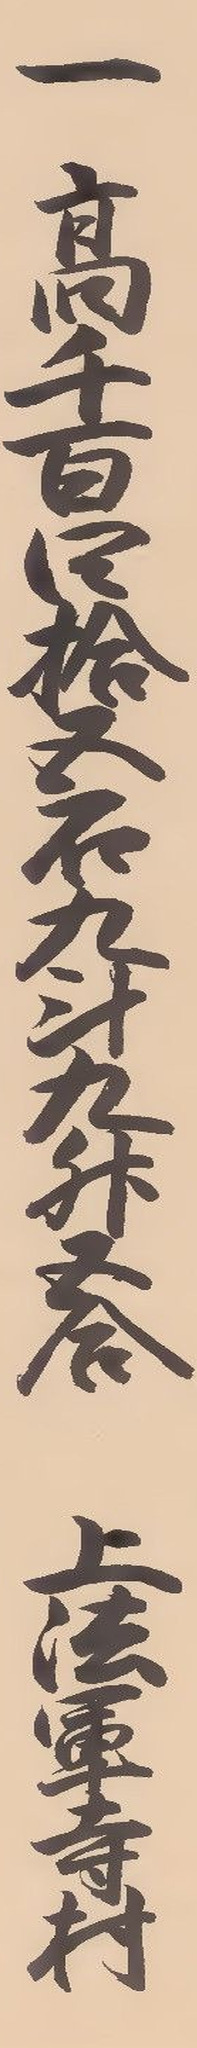一高千百四拾五石九斗九升五合上法軍寺村
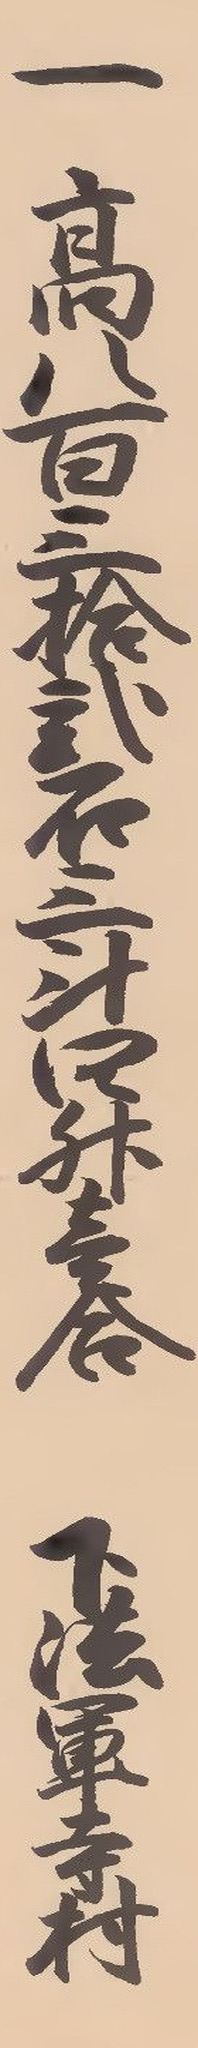一高八百三拾弐石三斗四升壱合下法軍寺村
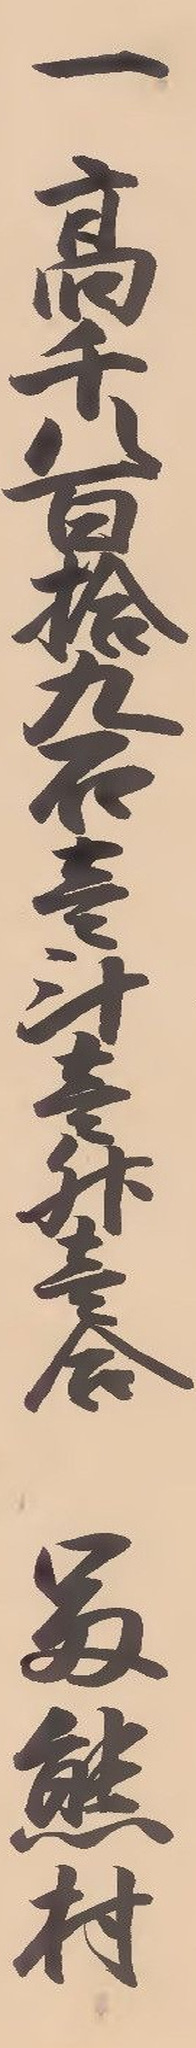一高千八百拾九石壱斗壱升壱合富熊村
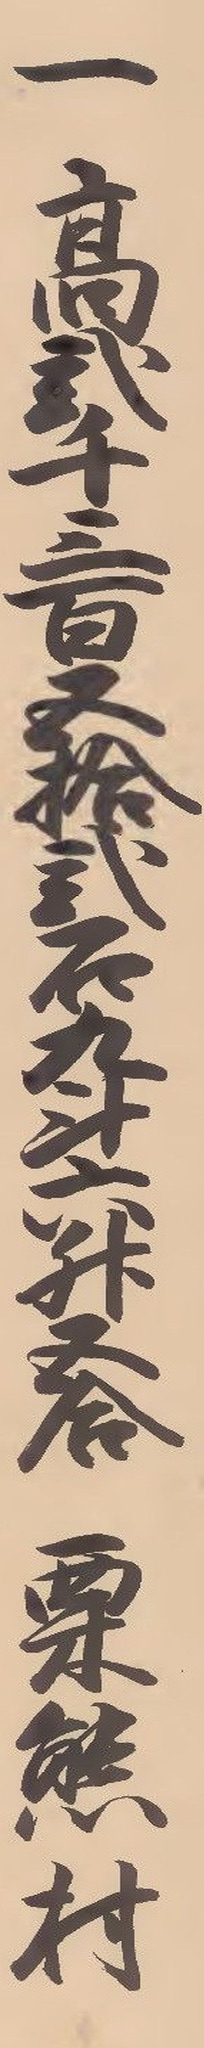一高弐千三百五拾弐石九斗六升五合栗熊村
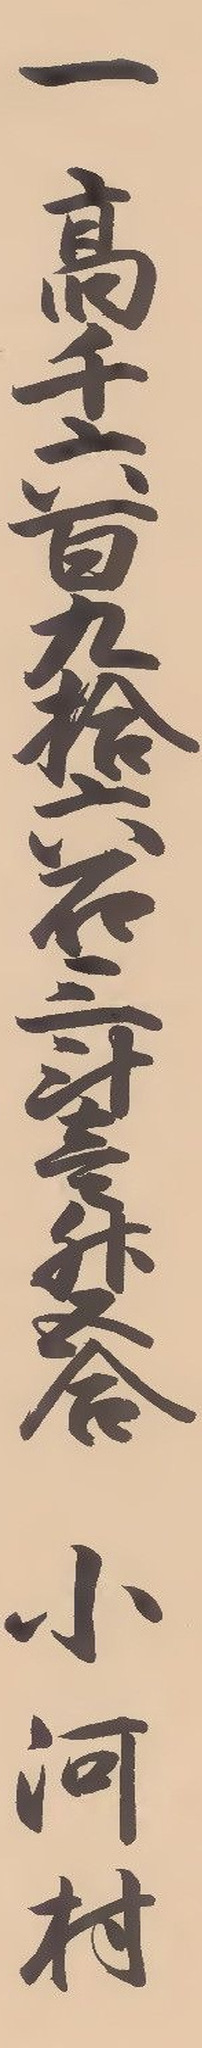一高千六百九拾六石三斗壱升五合小河村
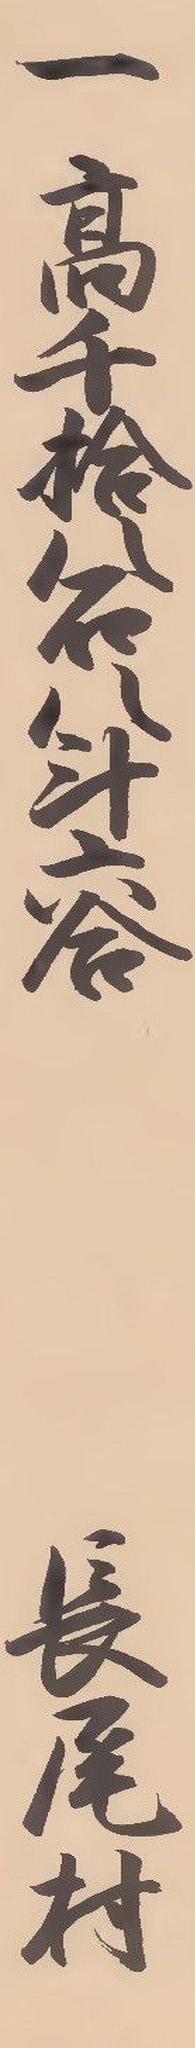一高千拾八石八斗六合長尾村
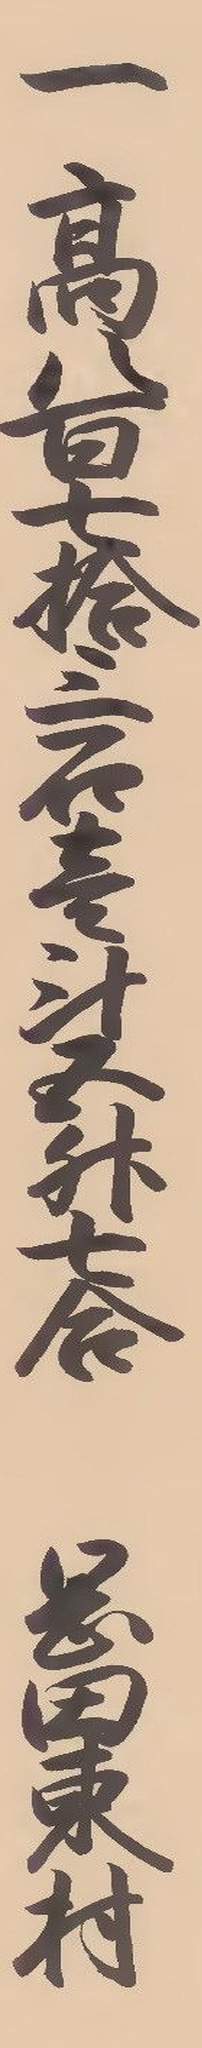一高八百七拾三石壱斗五升七合岡田東村

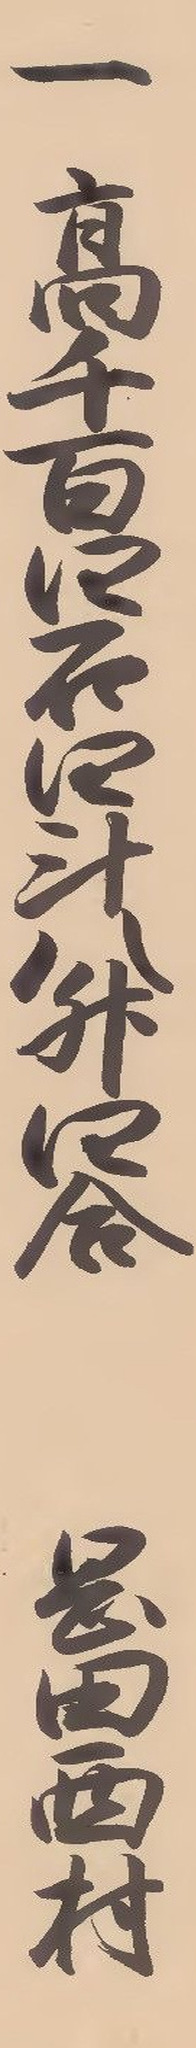一高千百四石四斗八升四合岡田西村
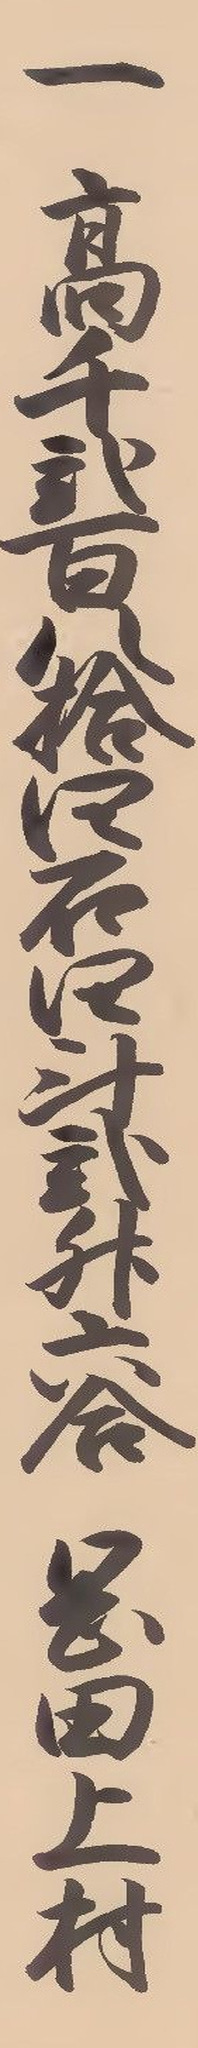一高千弐百八拾四石四斗弐升六合岡田上村
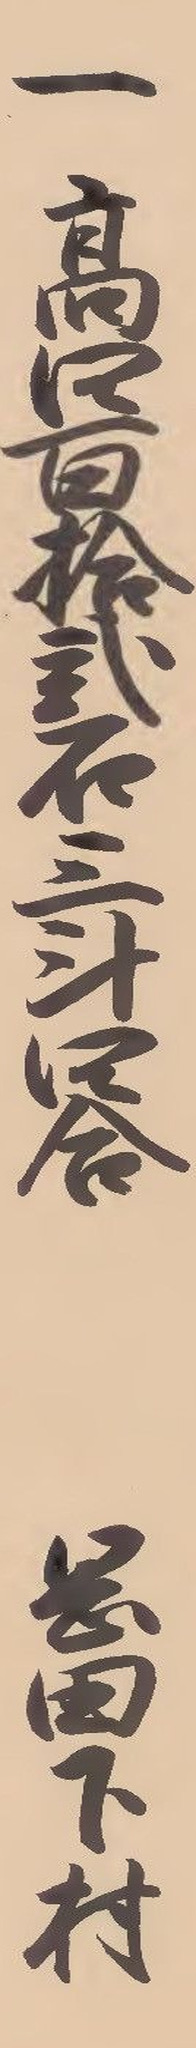一高四百拾弐石三斗四合岡田下村
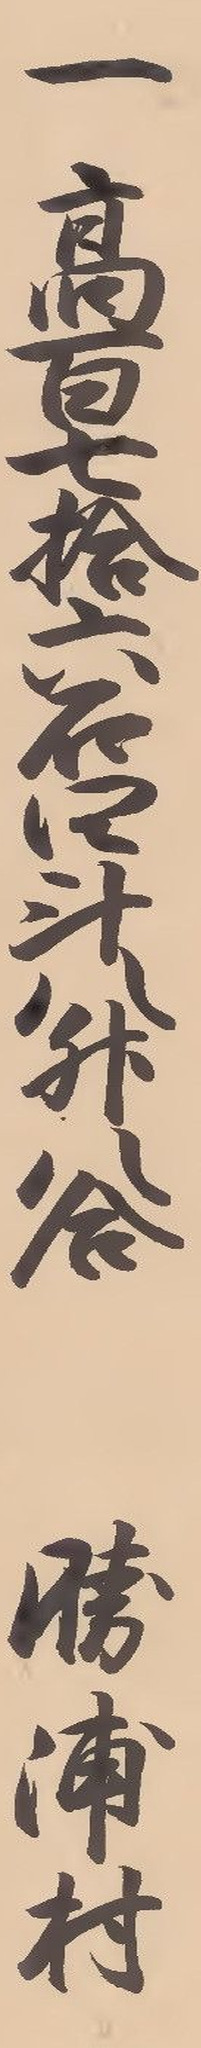一高百七拾六石四斗八升八合勝浦村
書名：讃岐国郷帳
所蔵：国立公文書館 National Archives of Japan
